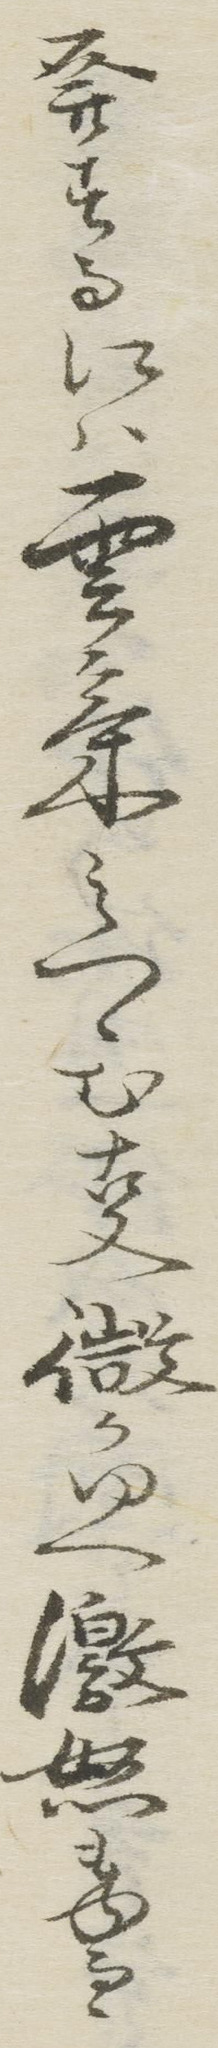発するにハ雲気之つゝむ事徴がゆへ激怒もゆるく
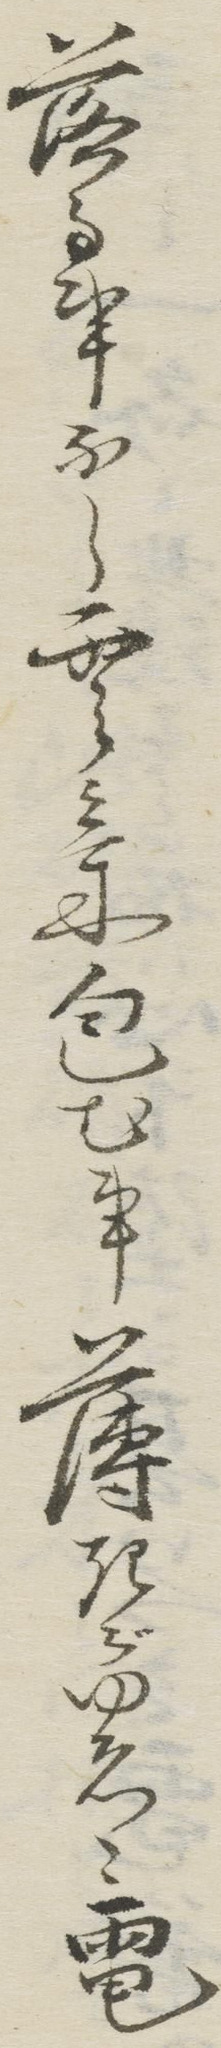落る事なし空気包む事薄きがゆえニ電
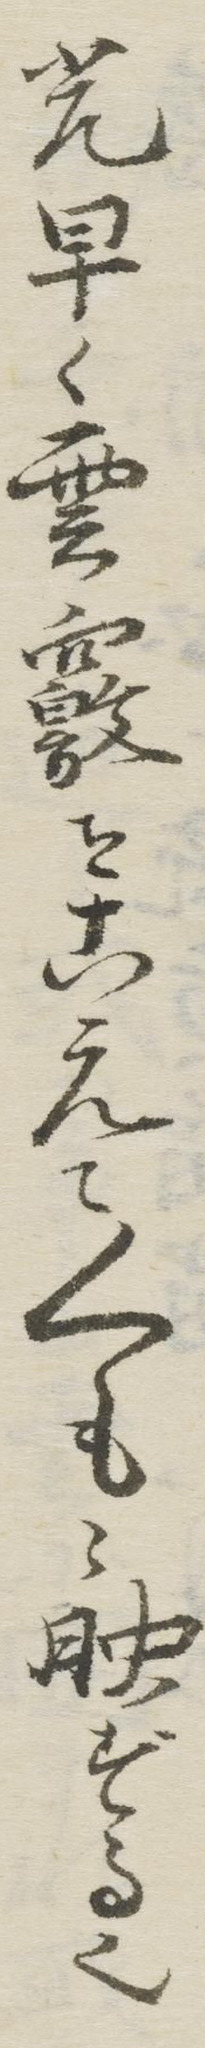光早く雲竅をこえてくもニ映ずる也
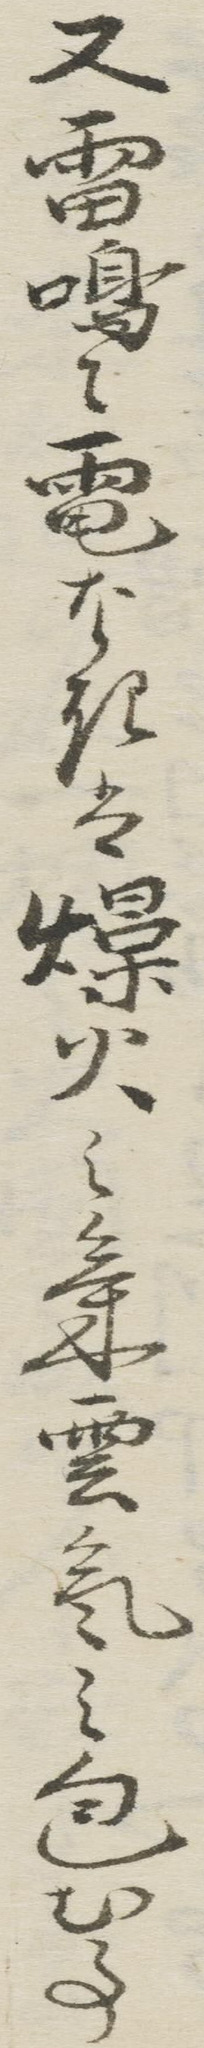又雷鳴と電なきは爆火の気雲気之包む事
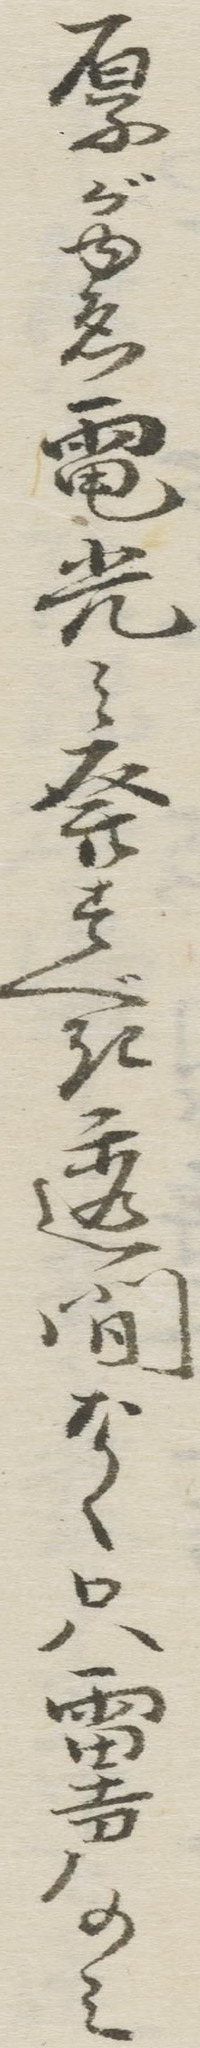厚がゆえ電光之発すべき透間なく只雷声ノミ
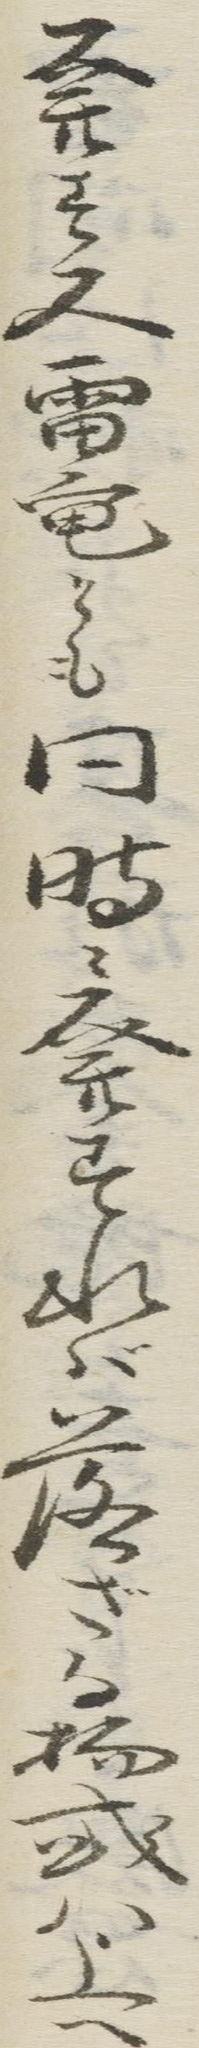発す又雷電とも同時ニ発すれバ落ざる物或ハ上へ
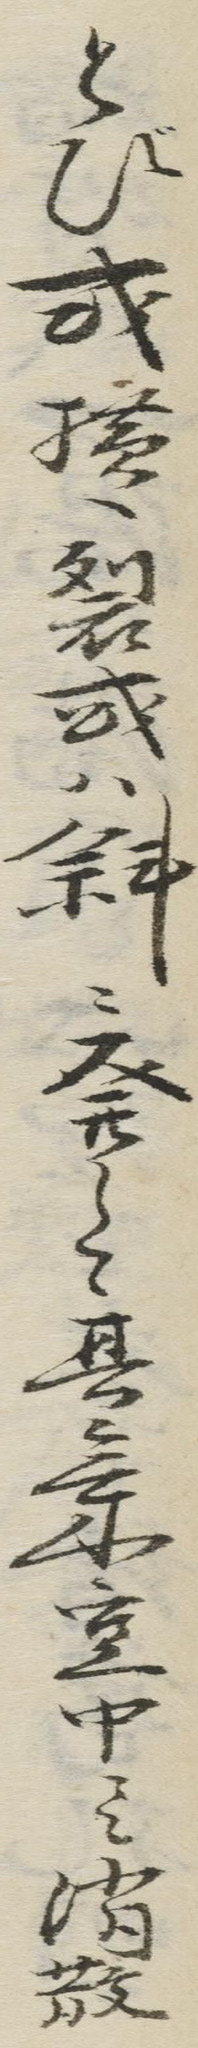とび或横へ裂或ハ斜ニ発して其気空中ニて消散
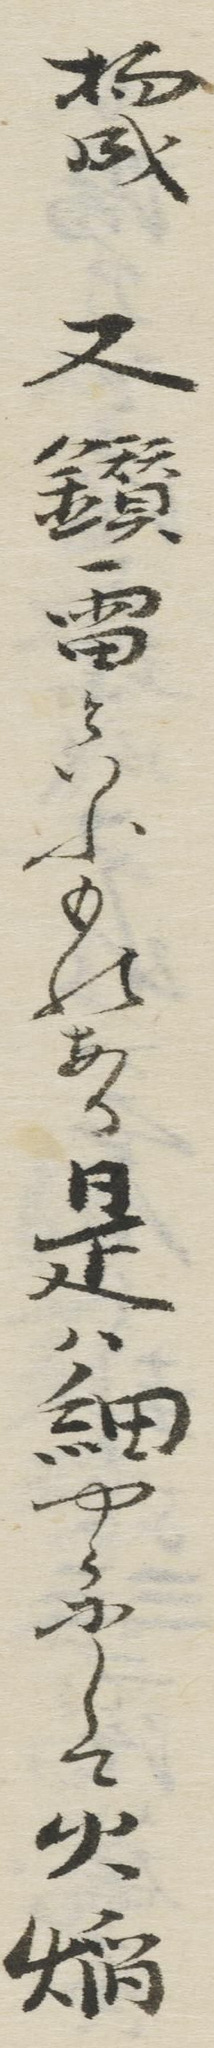物成又鑚雷といふものあり是ハ細やかにして火焔
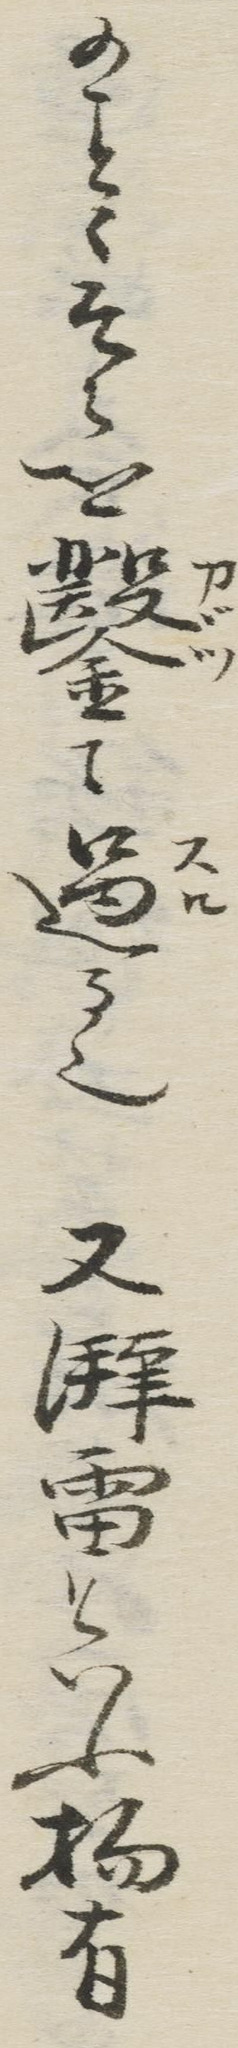のごとくそらを鑿て過る也又湃雷といふ物有
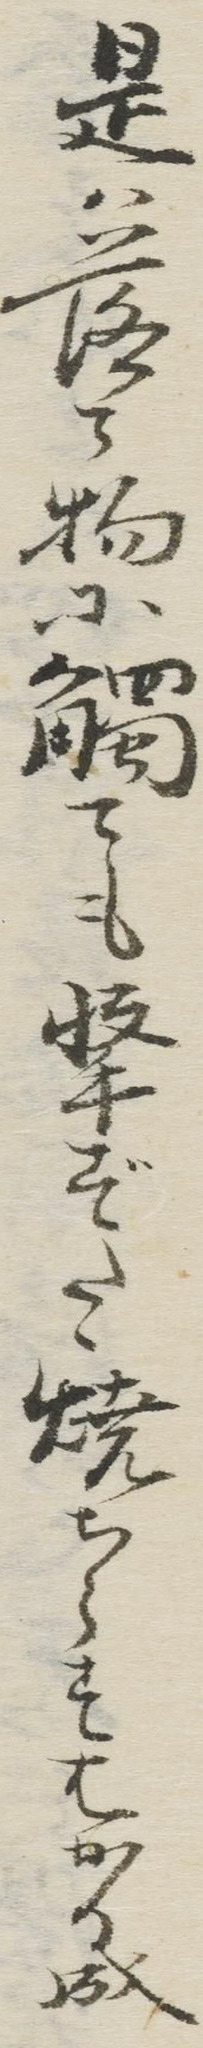是ハ落ち物に触ても撃ずたゝ焼きちらすはかり成
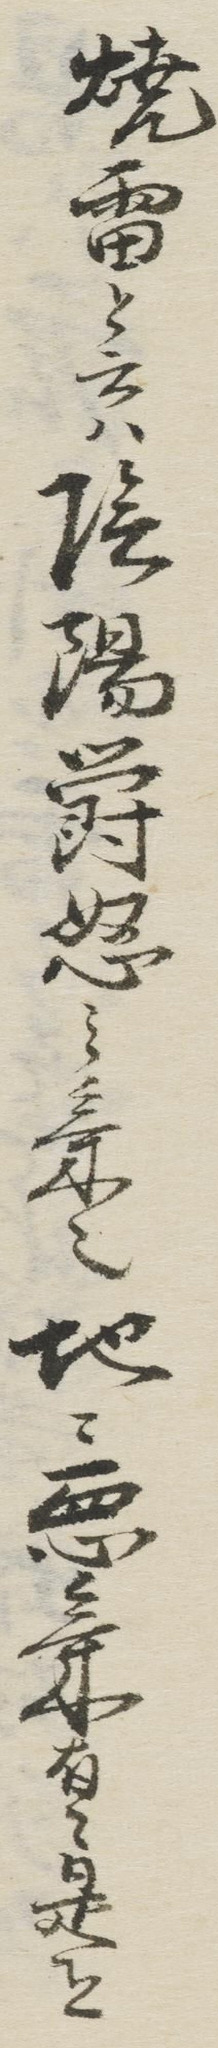焼雷と云ハ陰陽爵怒之気也地ニ悪気有て是を
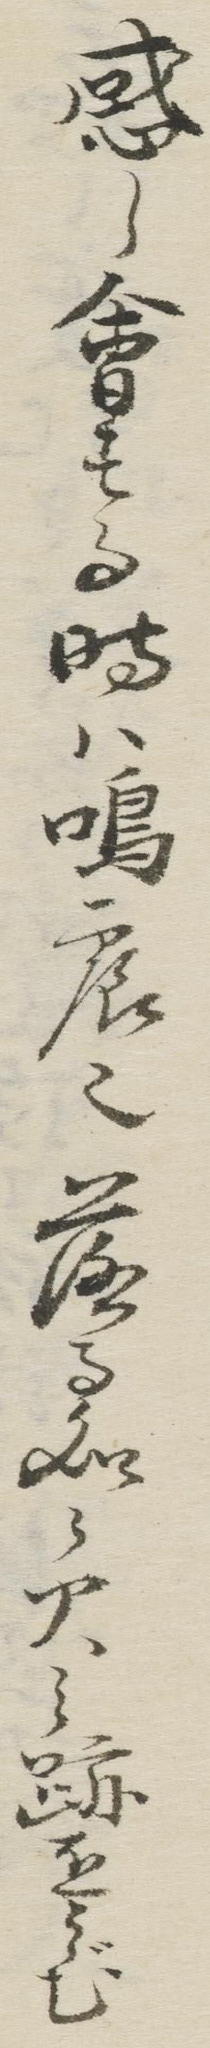感じ会する時ハ鳴震也落る処ニ火之跡をとゞむ
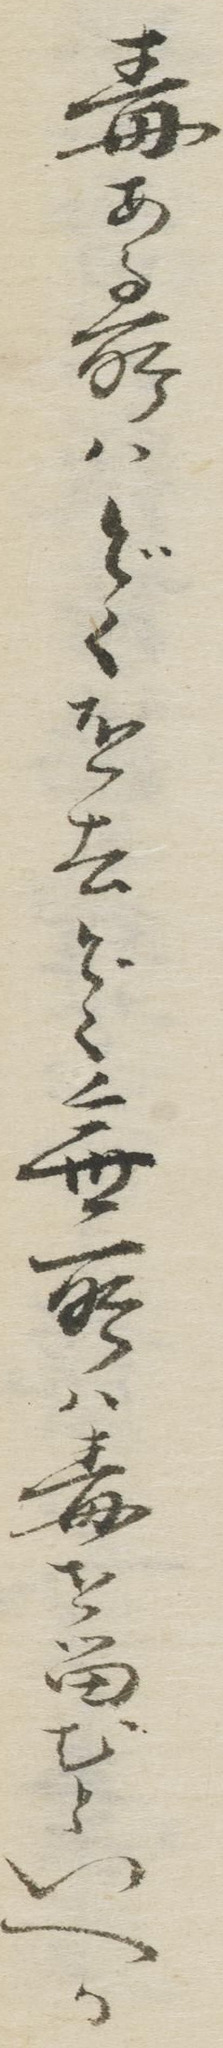毒ある所ハどくを去どく無所ハ毒を留むといへり

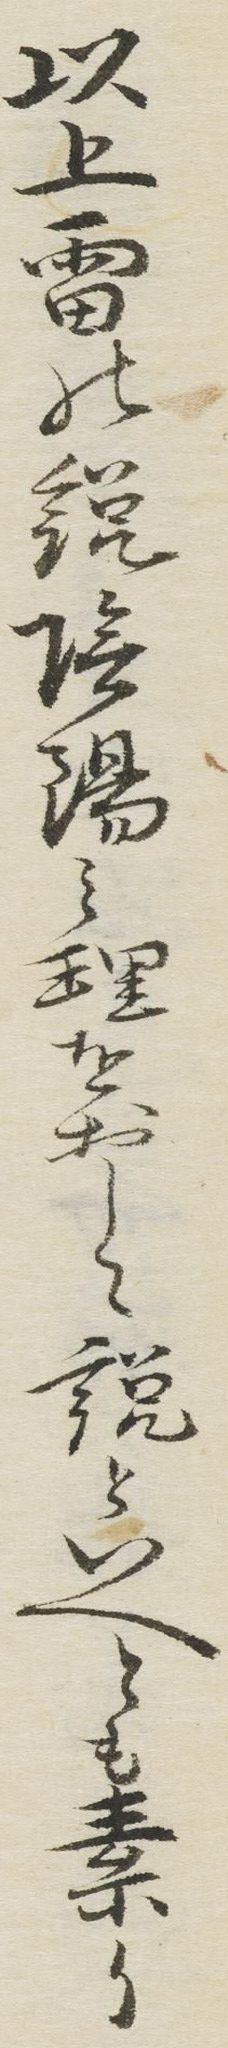以上雷の説陰陽之理をおして説といへとも素り
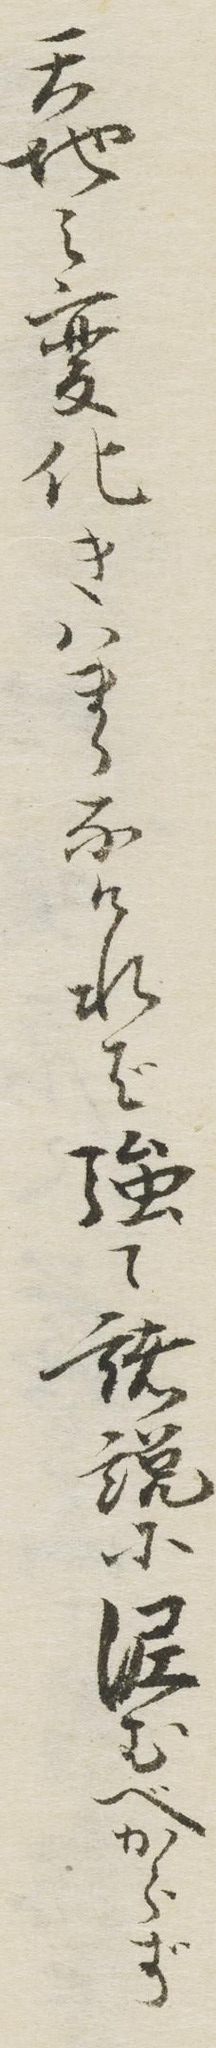天地之変化きハ真理なかれば強て諸説に泥むべからず
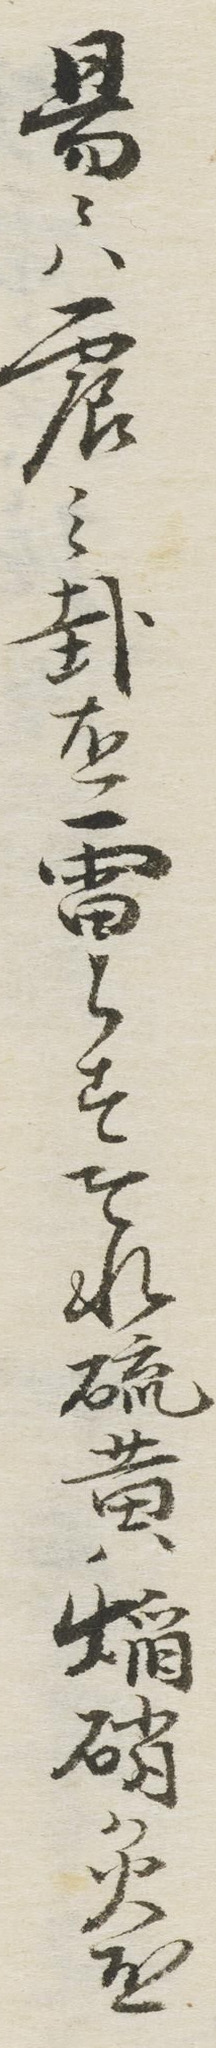易ニハ震之卦を雷とすそれ硫黄焔硝ハ火を
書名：諸国大地震大津波一代記
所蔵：東京大学地震研究所図書室 Earthquake Research Institute Library, The University of Tokyo, JAPAN
